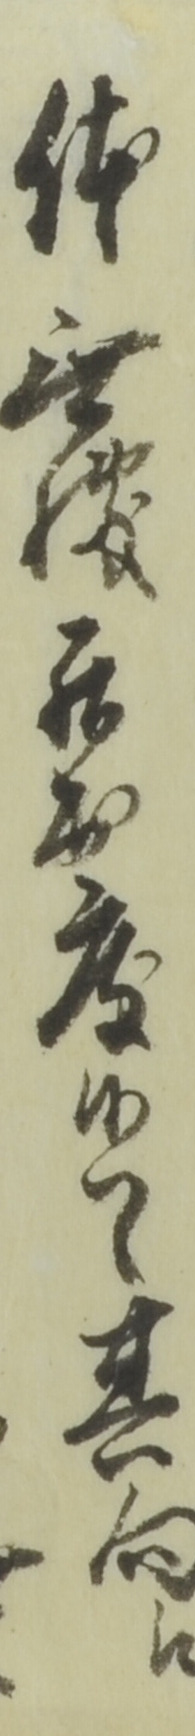体無拠罷出処候ハヽ其向江
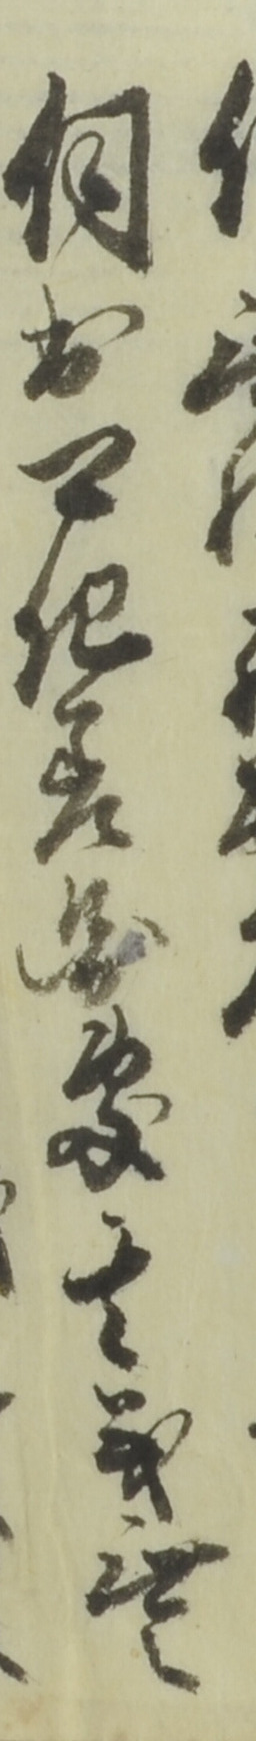伺出可被差図処は義無之
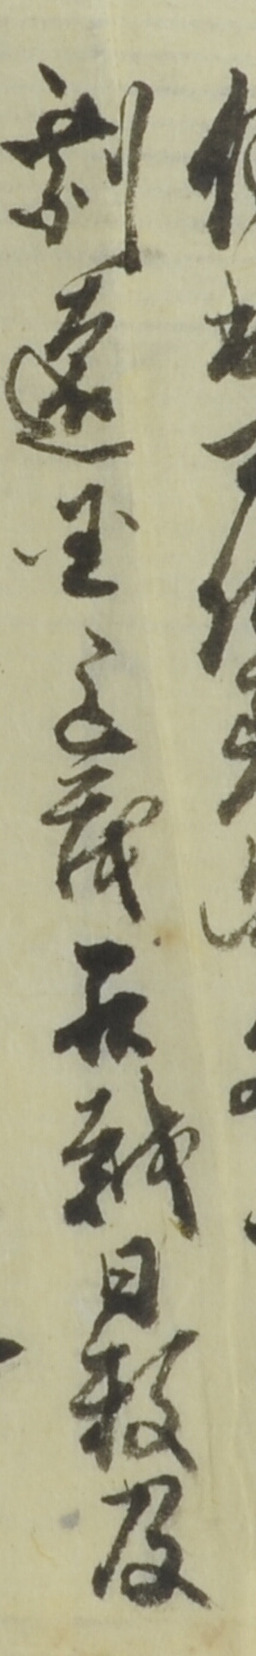剰遠国迄も罷越日数及
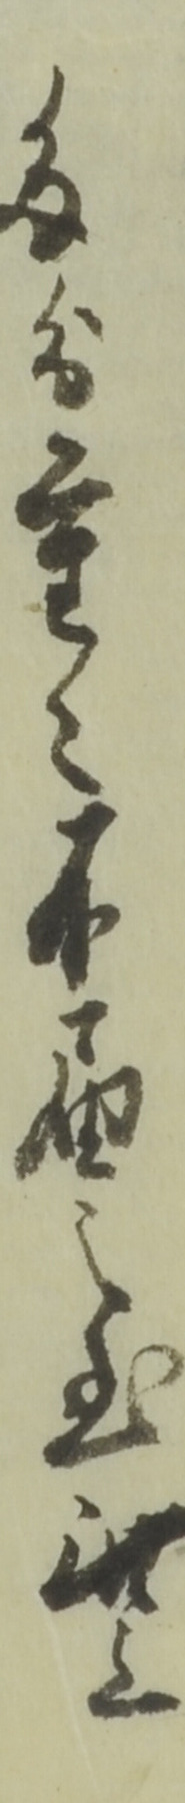多分重々不届之至此上
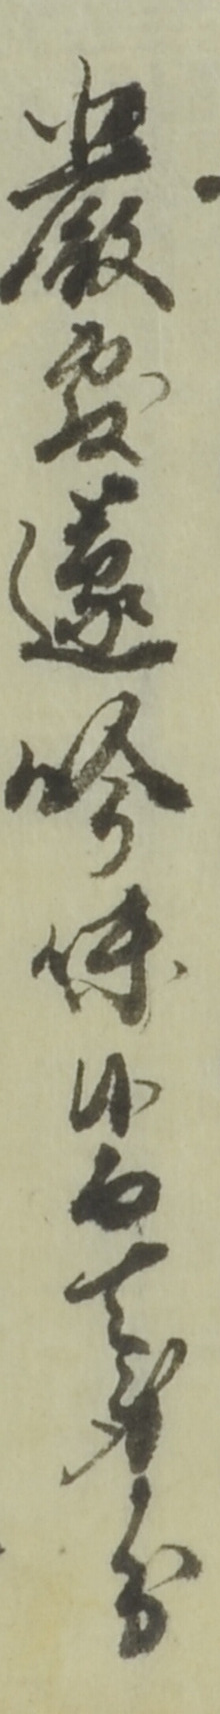厳敷遂吟味候而は身分
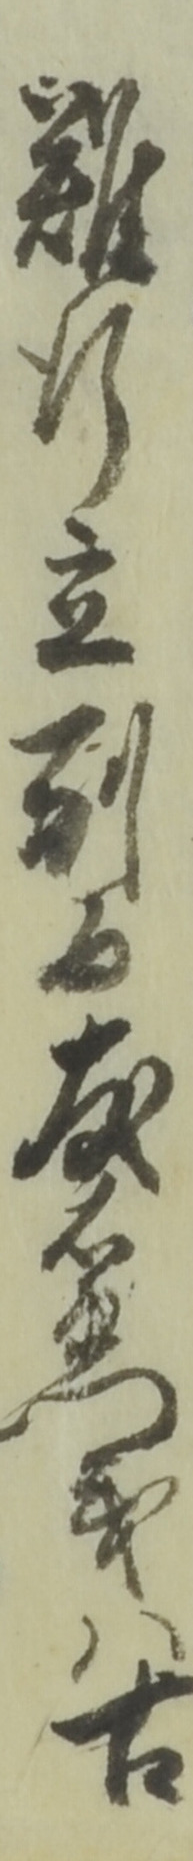難行立別而友右衛門義ハ古
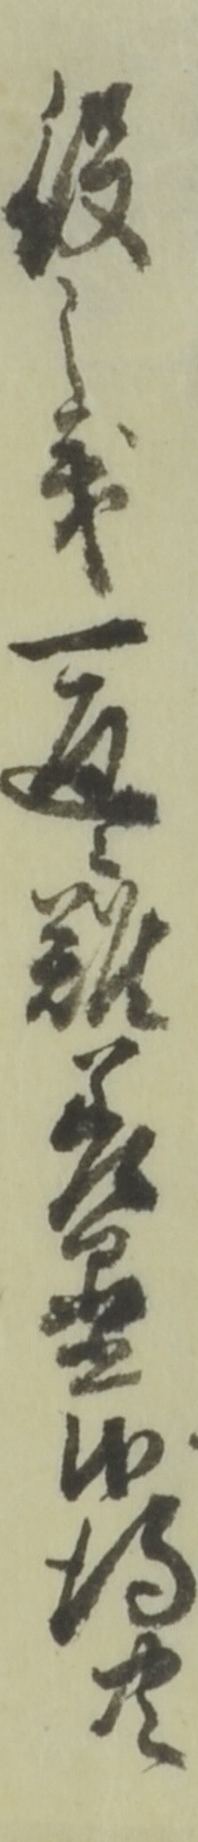役之義一通ニ難差置候得共
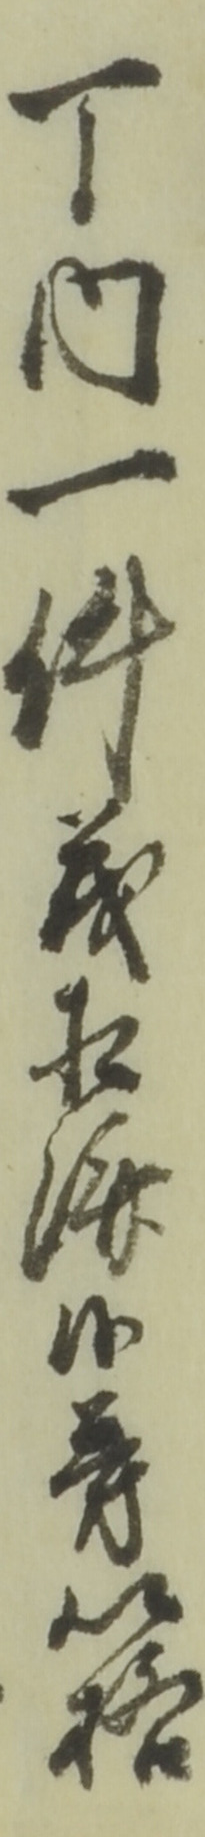丁内一件も相済候旁以格
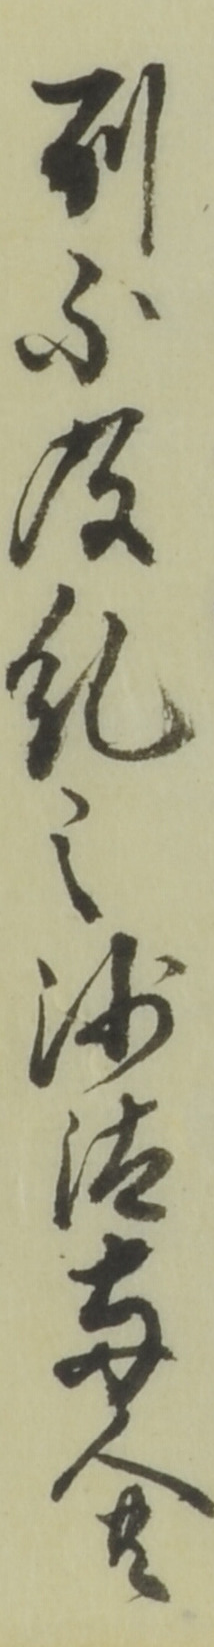別不及糺之沙汰両人共
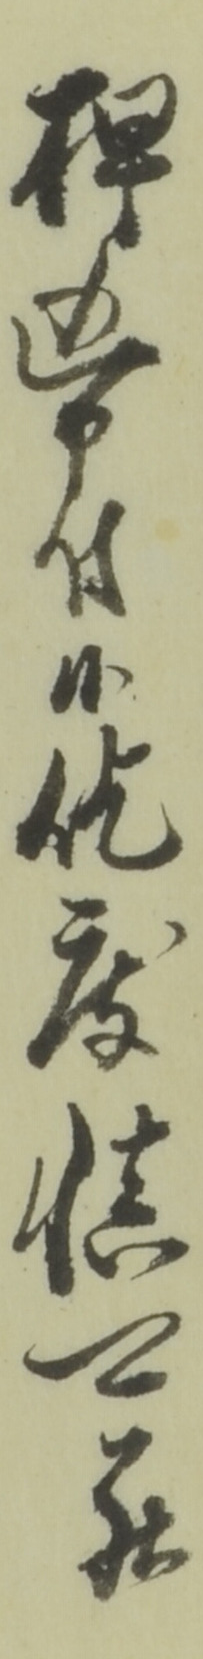押込申付候屹度慎可被
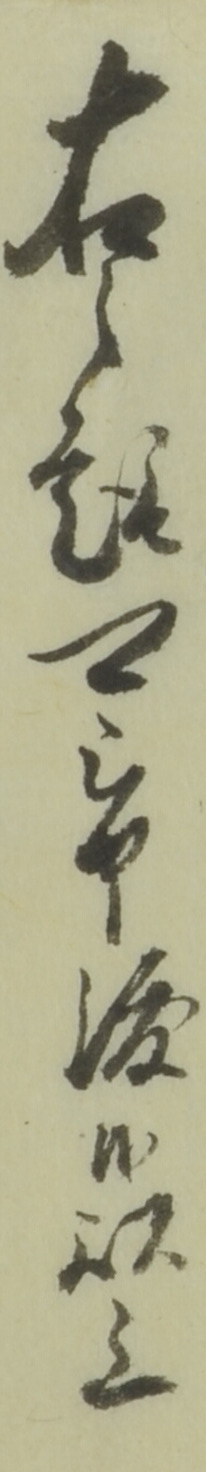右之趣可被申渡候以上
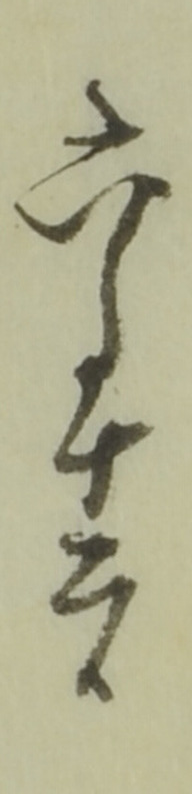六月十二日
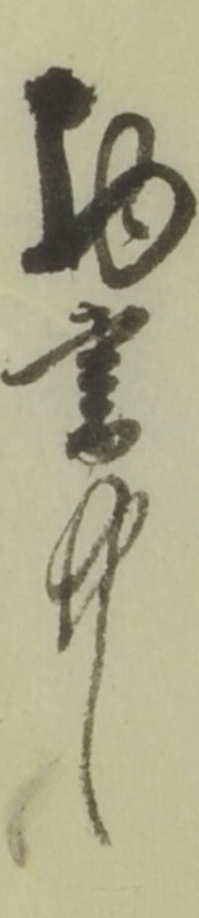物書中

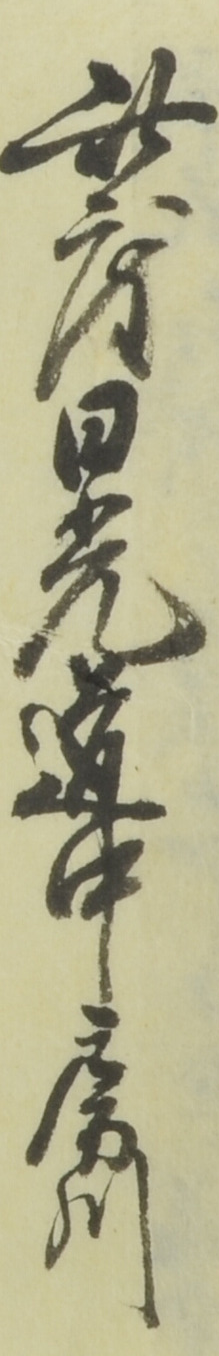此度日光道中房川
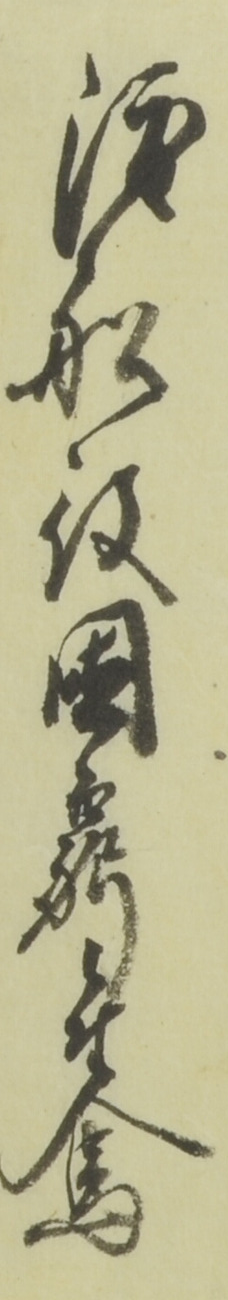渡船役困窮ニ付人馬
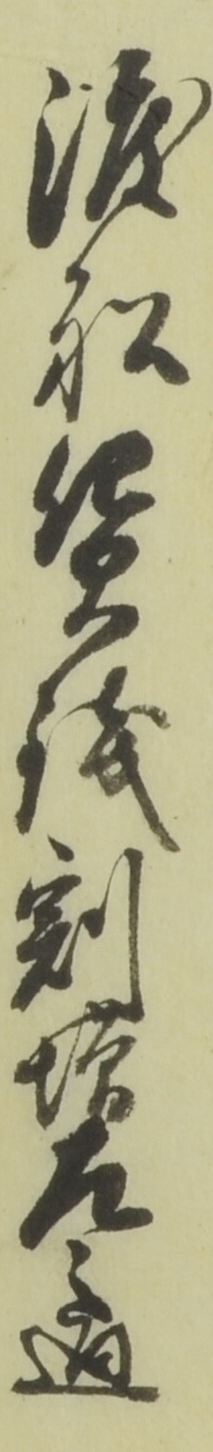渡船賃銭割増左之通
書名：御触書御書附控
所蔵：伊那市立高遠町図書館・合同会社AMANE
